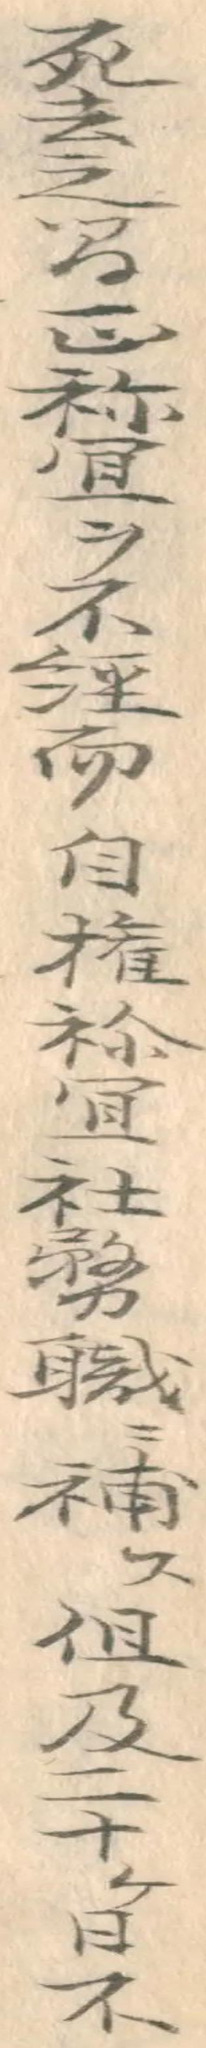死去之間正祢宜ヲ不経而自権祢宜社務職ニ補ス但及二十ケ日不
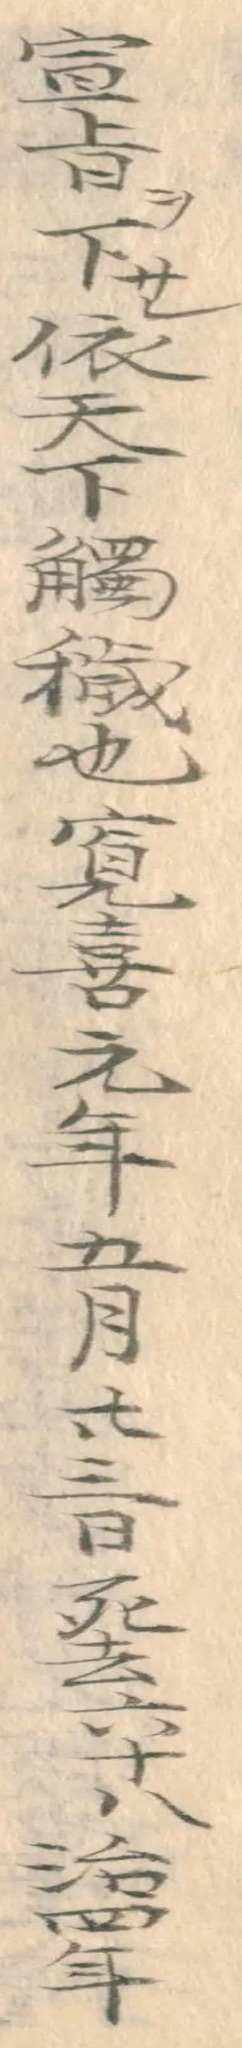宣旨ヲ下サレ依天下触穢也寛喜元年五月廿三日死去六十八治四年
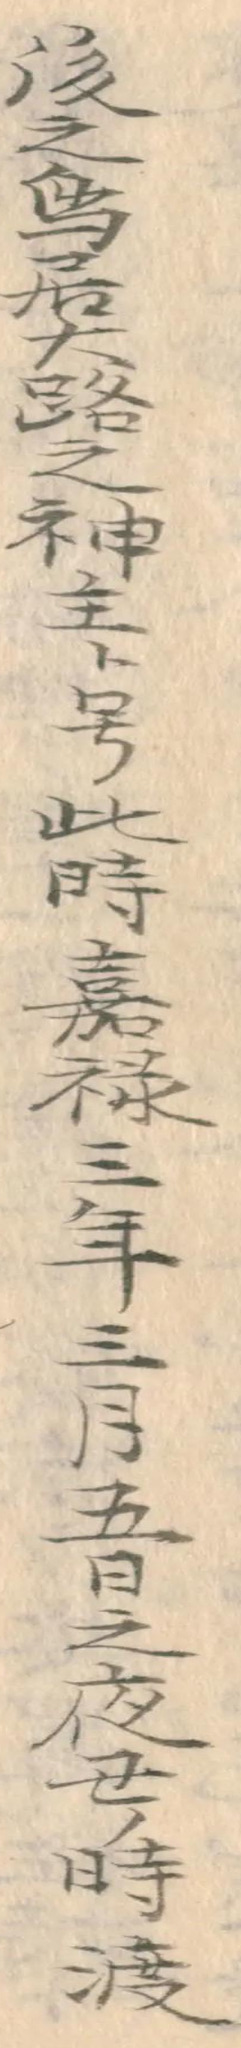後之鳥居大路之神主ト号此時嘉禄三年三月五日之夜丑ノ時渡
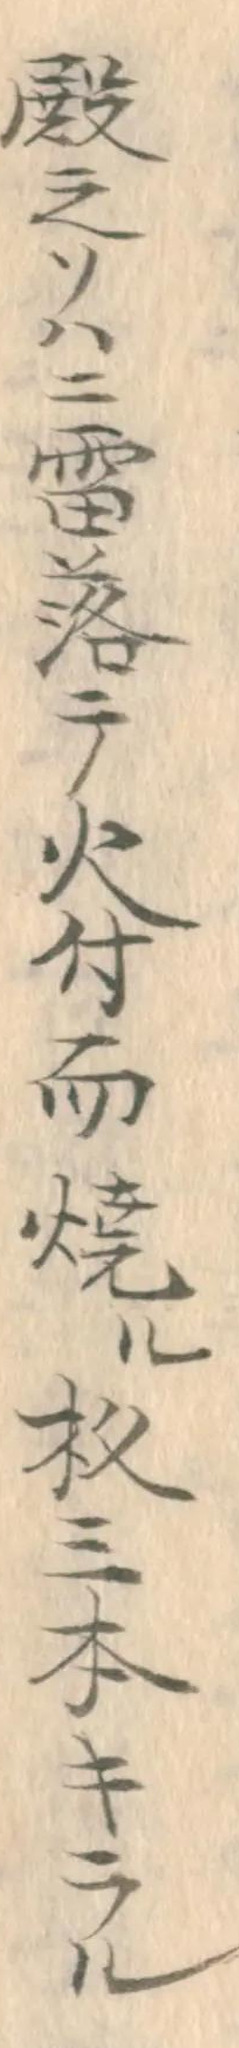殿之ソハニ雷落テ火付而焼ル杉三本キラル
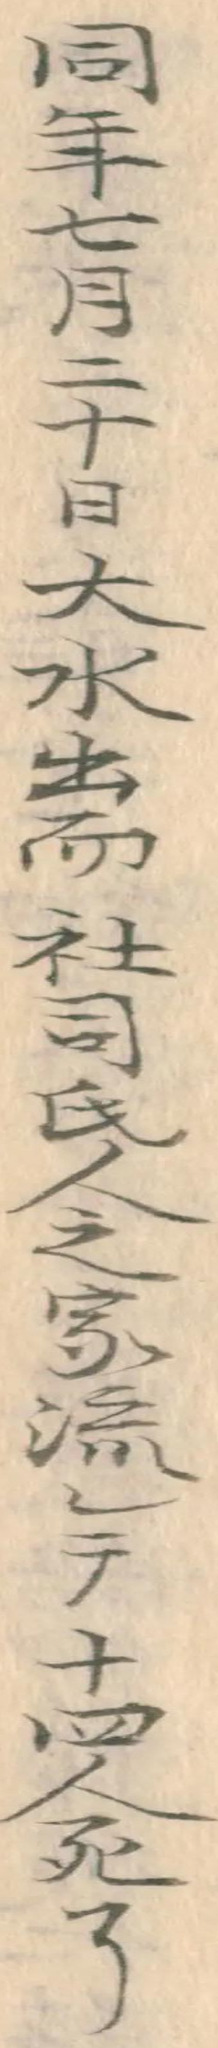同年七月二十日大水出而社司氏人之家流レテ十四人死了
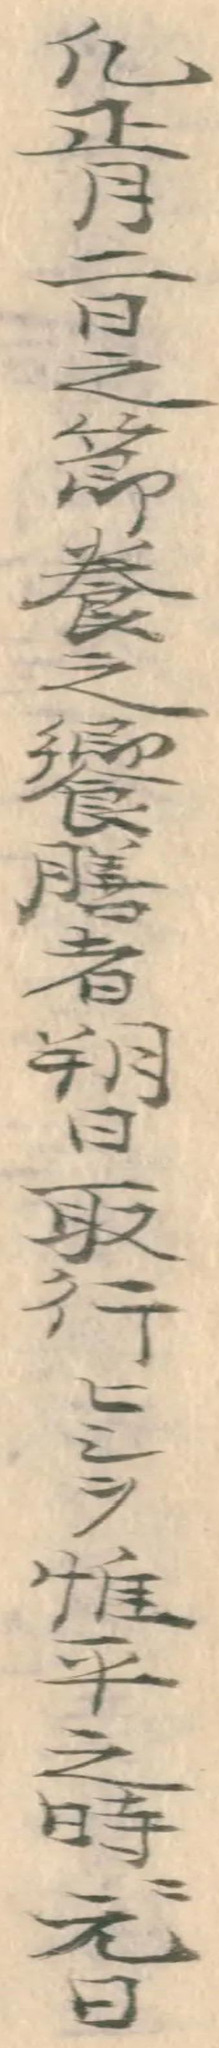凡正月二日之節養之饗膳者朔日取行ヒシテ惟平之時ニ元日
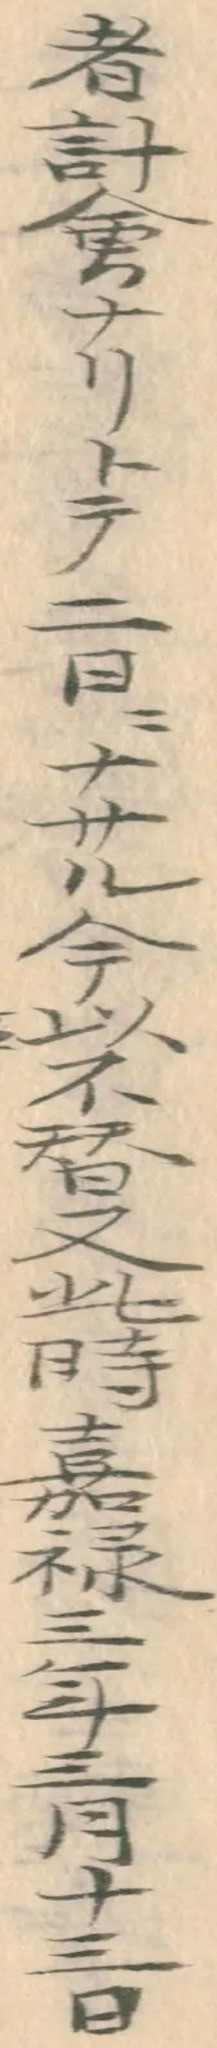者計会ナリトテ二日ニナサル今以不替又此時嘉禄三年三月十三日
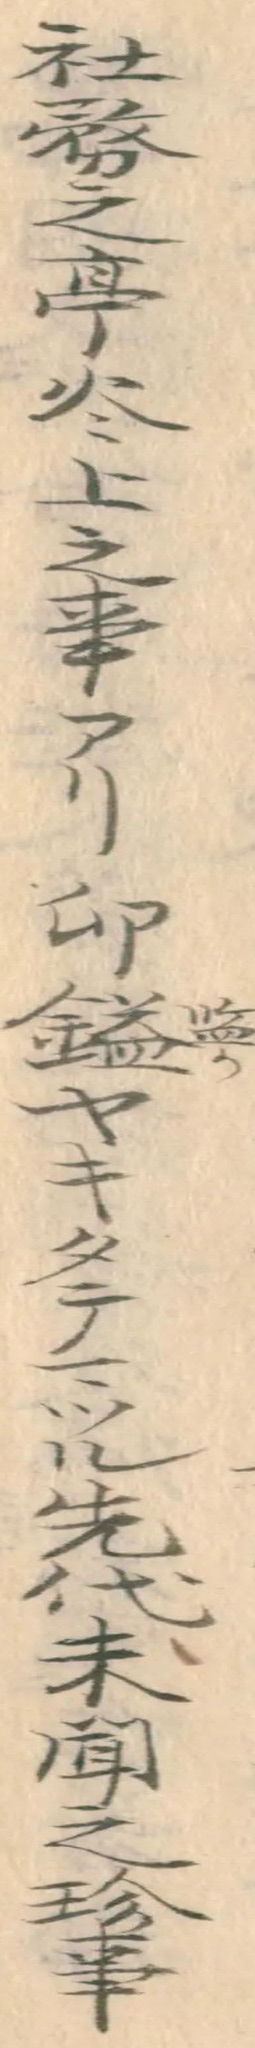社務之亭炎上之事アリ印鎰ヤキタテマツル先代未聞之珍事
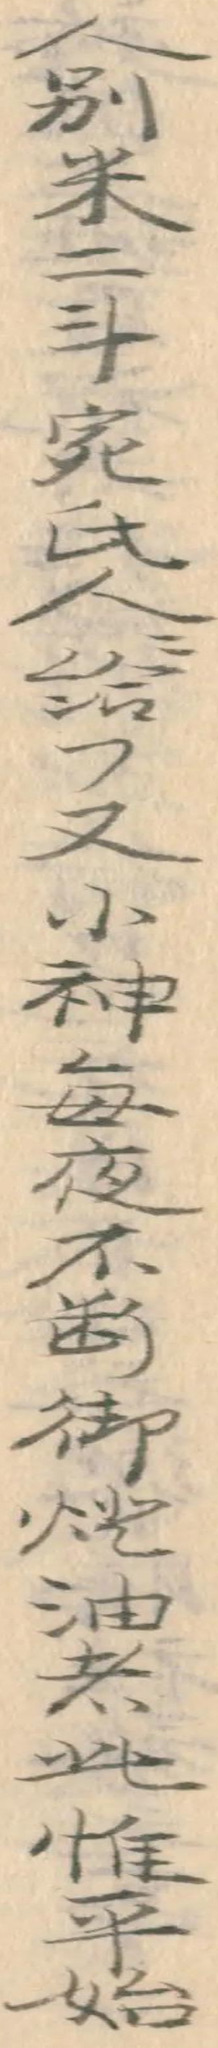人別米二斗宛氏人ニ給フ又小神毎夜不断御燈油者此惟平始
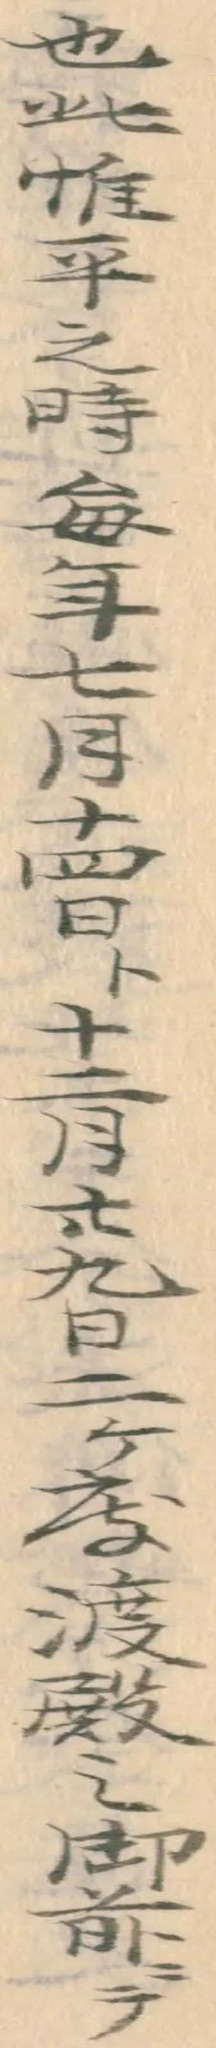也此惟平之時毎年七月十四日ト十二月廿九日二ケ度渡殿之御前ニテ
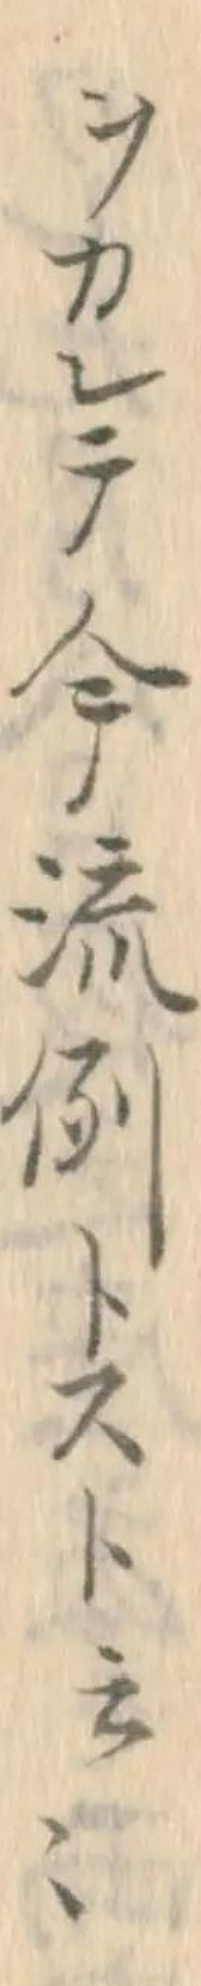ヲカレテ今流倒トスト云々
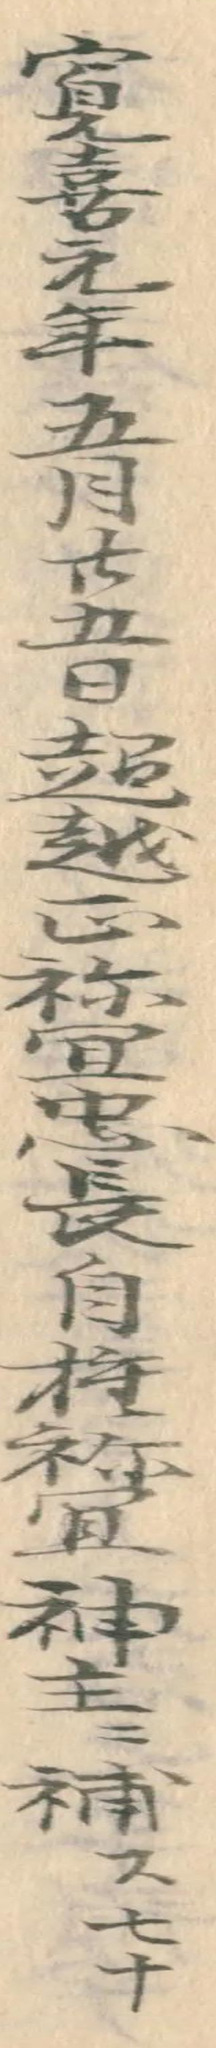寛喜元年五月廿五日超越正祢宜忠長自権祢宜神主ニ補ス七十
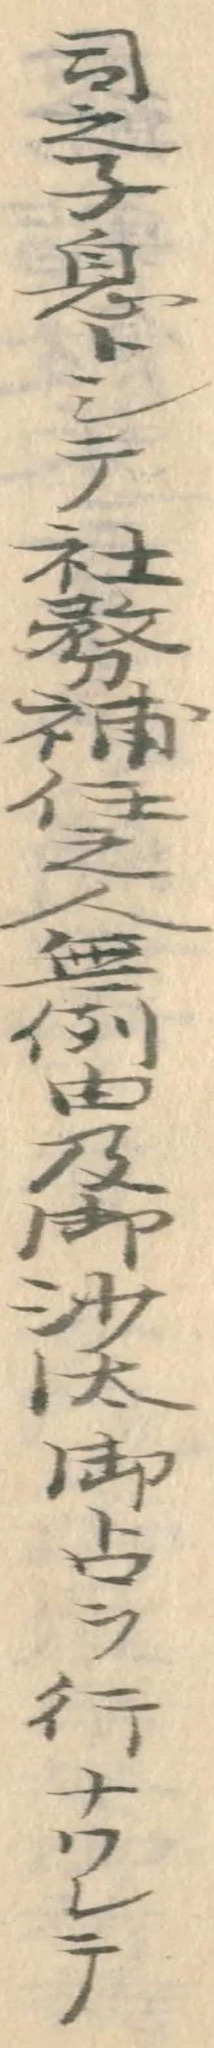司之子息トシテ社務補任之人無例由及御沙汰御占ヲ行ナワレテ
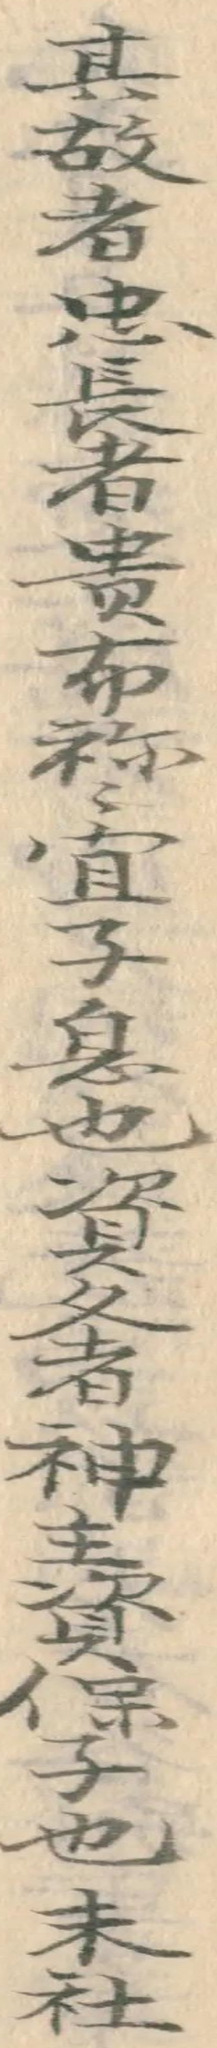其故者忠長者貴布祢々宜子息也資久者神主資保子也末社
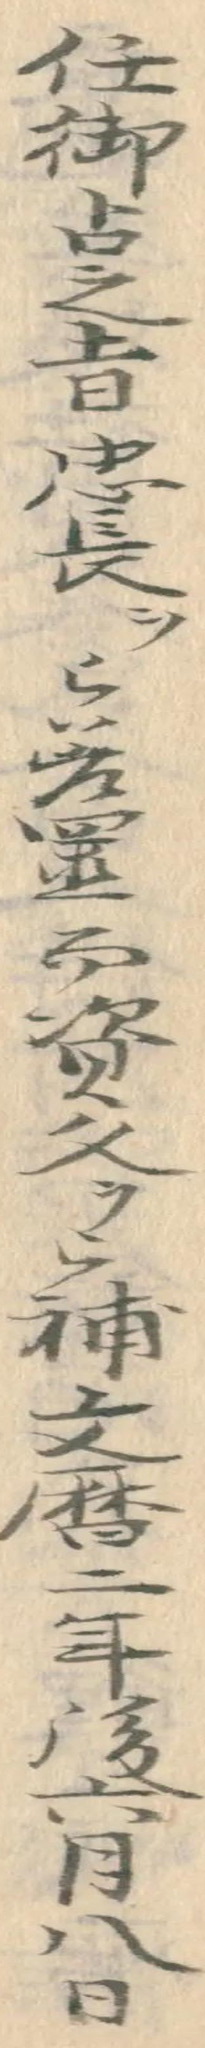任御占之旨忠長ヲ被差置而資久ヲ被補文暦二年後六月八日
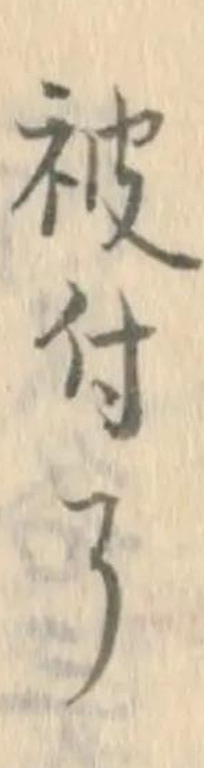被付了
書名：賀茂社記録. 第24冊
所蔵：国立国会図書館 National Diet Library, JAPAN
